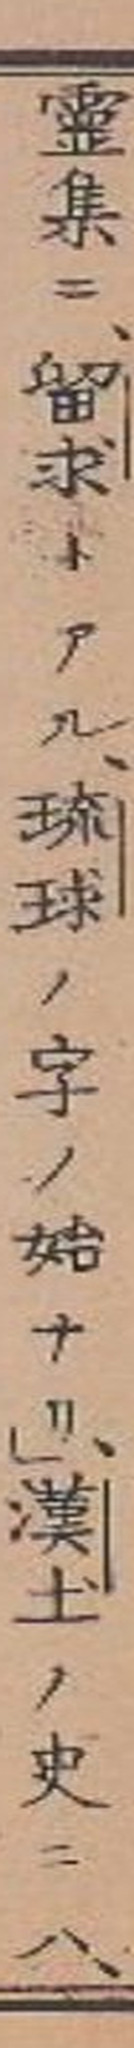霊集ニ、留求トアル、琉球ノ字ノ始ナリ、」漢土ノ史ニハ、
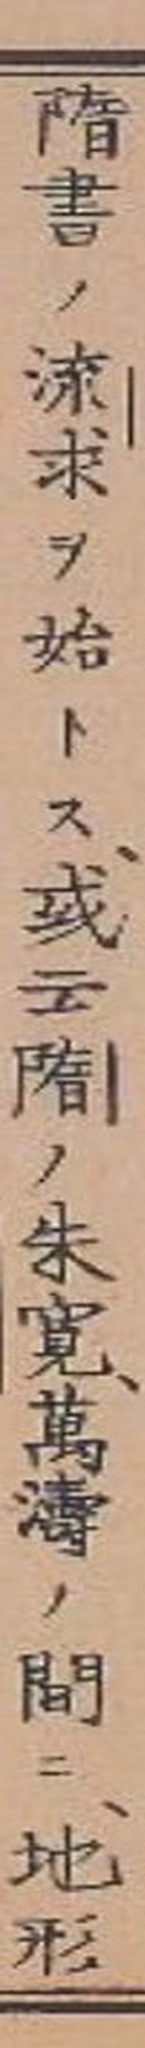隋書ノ流求ヲ始トス、或云隋ノ朱寛、万濤ノ間ニ、地形
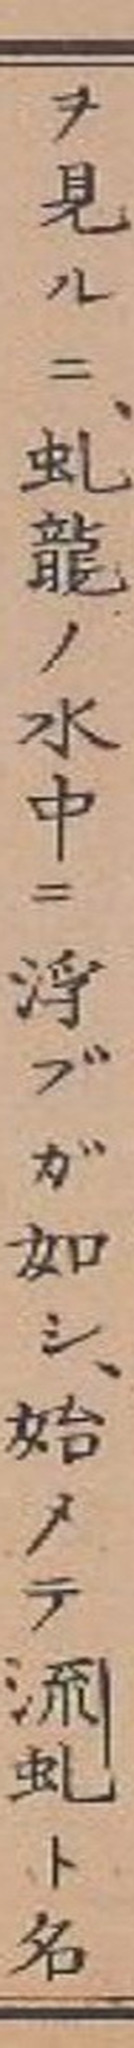ヲ見ルニ、虬竜ノ水中ニ浮ブガ如シ、始メテ流虬ト名
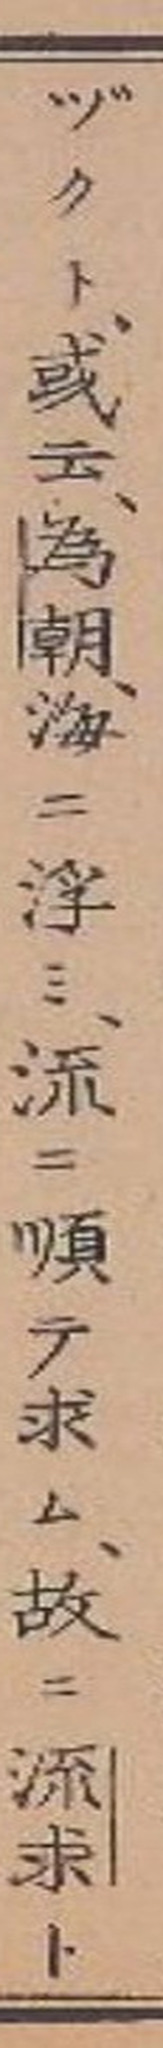ヅクト、或云、為朝、海ニ浮ミ、流ニ順テ求ム、故ニ流求ト
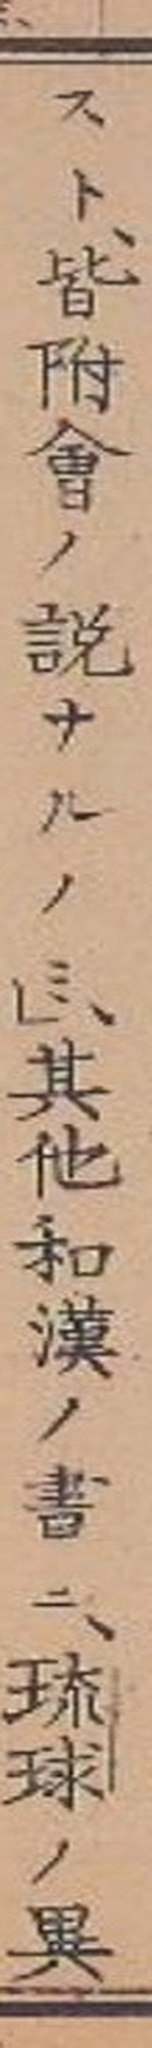スト、皆附会ノ説ナルノミ、」其他和漢ノ書ニ、琉球ノ異
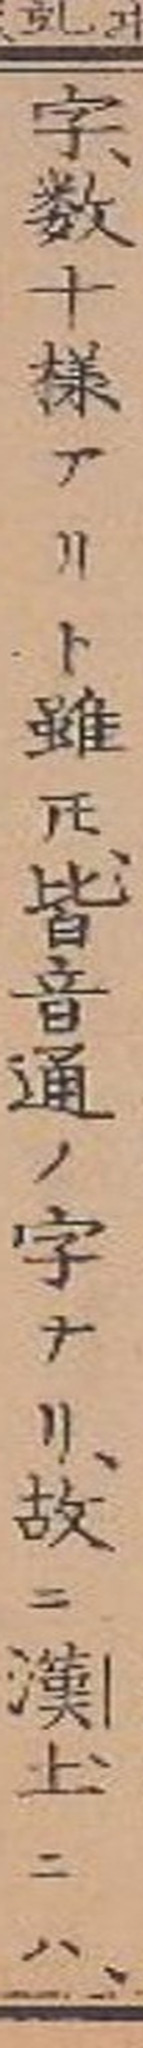字、数十様アリト雖トモ、皆音通ノ字ナリ、故ニ漢土ニハ、
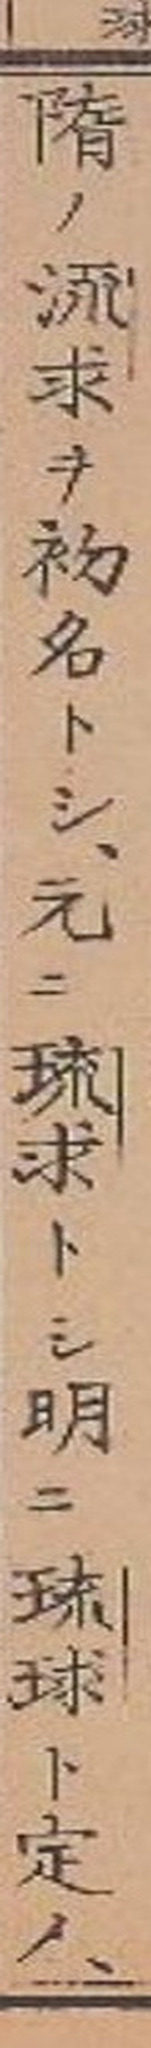隋ノ流求ヲ初名トシ、元ニ琉求トシ明ニ琉球ト定メ、
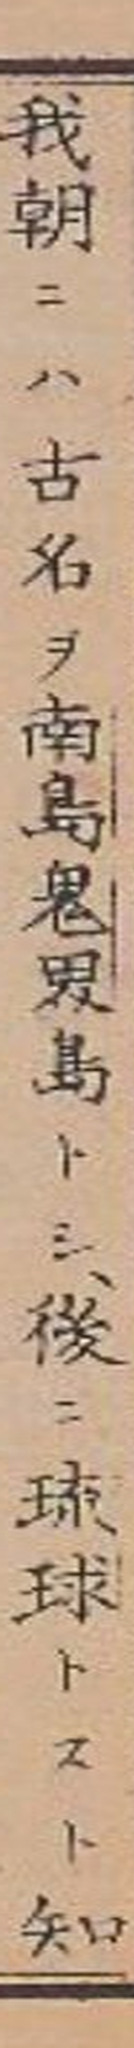我朝ニハ古名ヲ南島鬼界島トシ、後ニ琉球トスト知
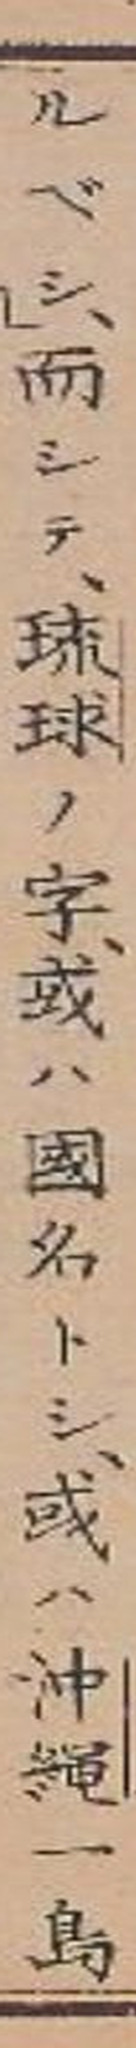ルベシ、」而シテ、琉球ノ字、或ハ国名トシ、或ハ沖縄一島
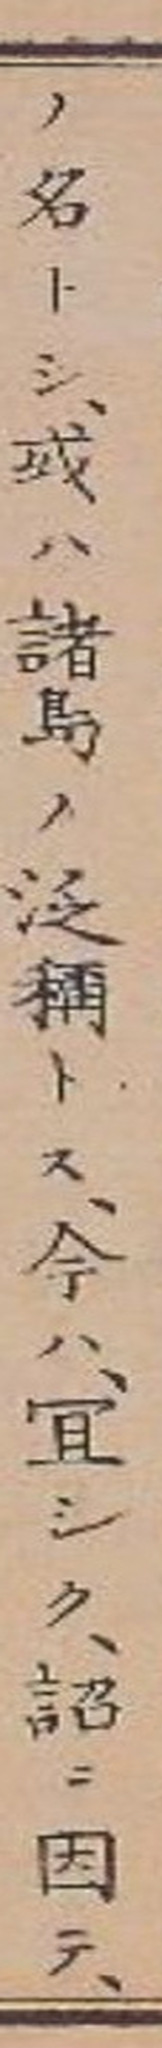ノ名トシ、或ハ諸島ノ泛称トス、今ハ、宜シク、詔ニ因テ、
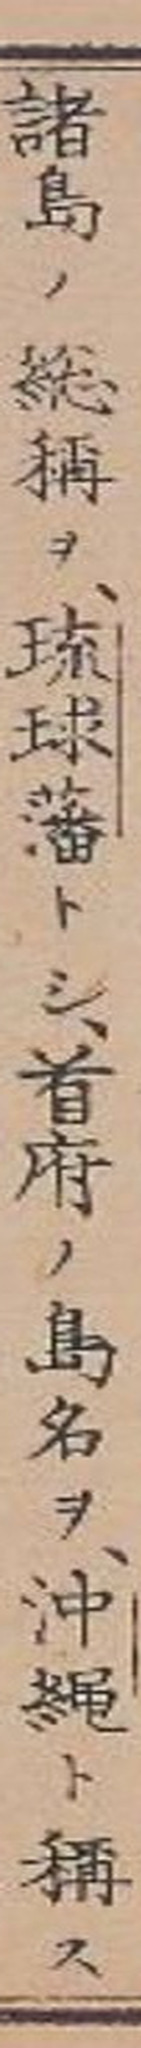諸島ノ総称ヲ、琉球藩トシ、首府ノ島名ヲ、沖縄ト称ス
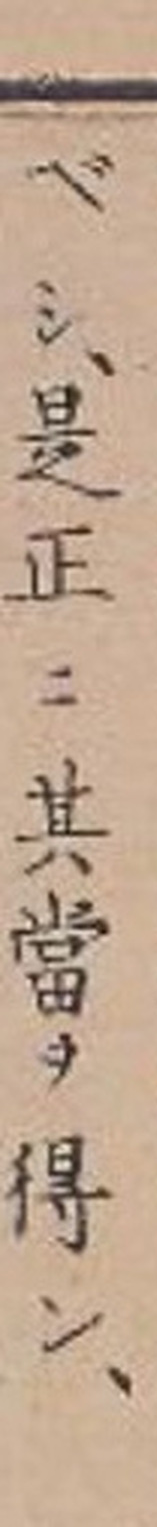ベシ、是正ニ其当ヲ得ン、
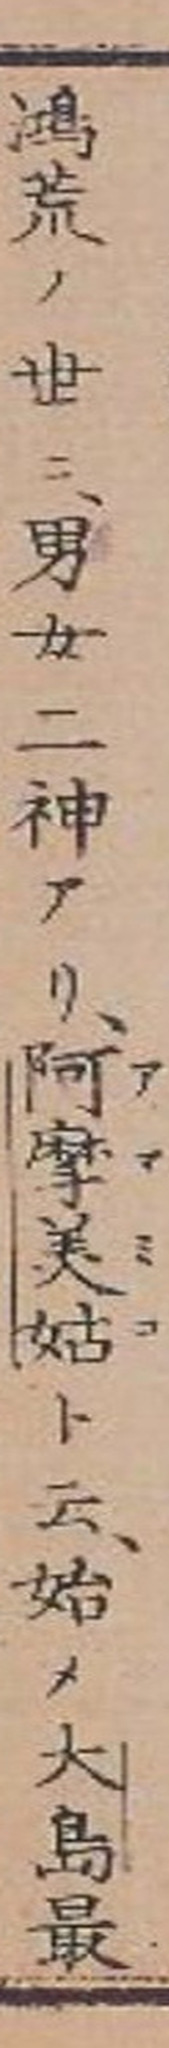鴻荒ノ世ニ、男女二神アリ、阿摩美姑ト云、始メ大島最
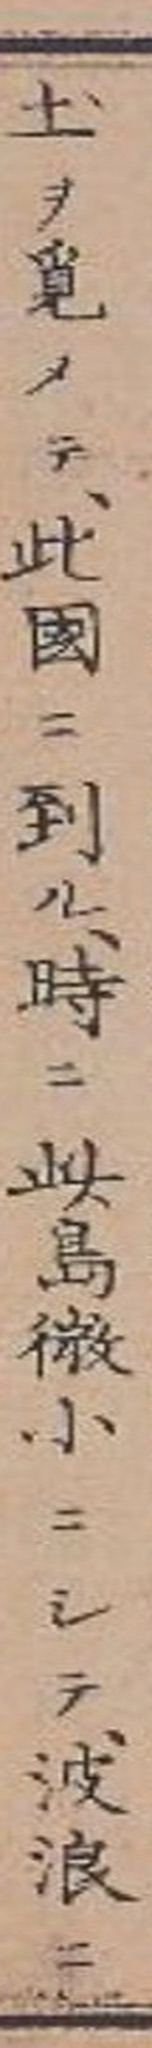土ヲ覓メテ、此国ニ到ル、時ニ此島微小ニシテ、波浪ニ
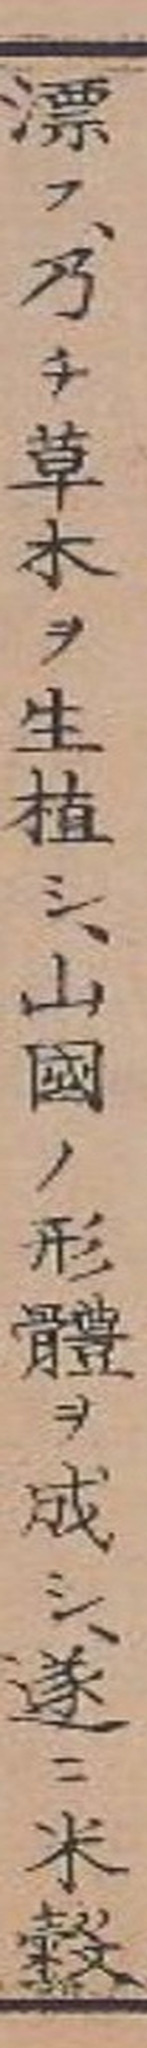漂フ、乃チ草木ヲ生植シ、山国ノ形体ヲ成シ、遂ニ米穀

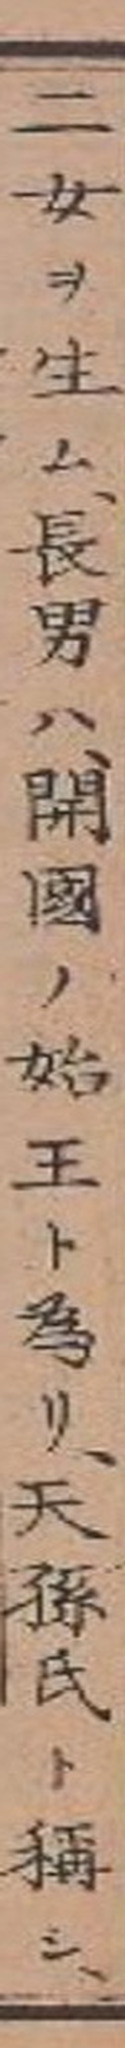二女ヲ生ム、長男ハ、開国ノ始王ト為リ、天孫氏ト称シ、
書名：琉球新誌 巻上
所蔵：University of the Ryukyus Library
